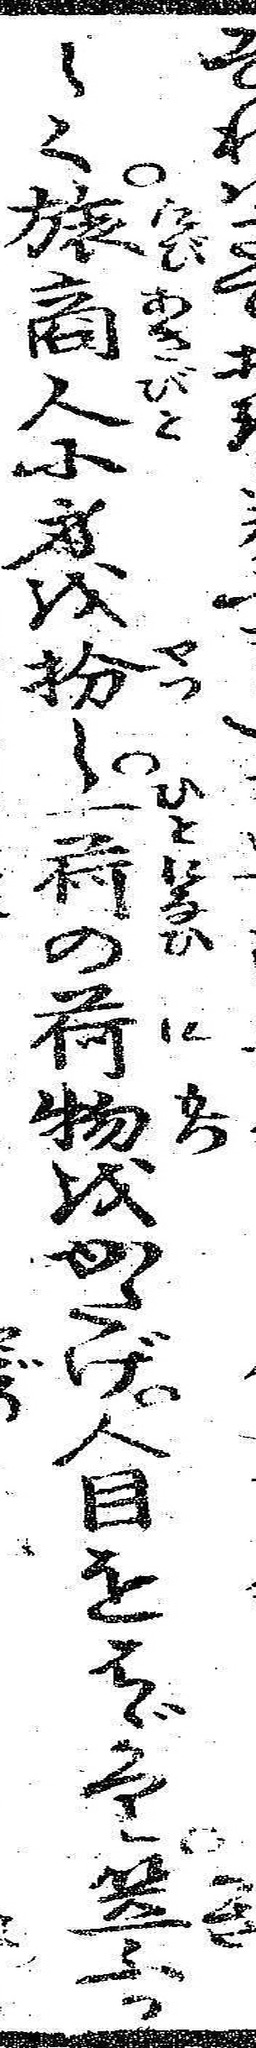しく。旅商人に身を扮し。一荷の荷物をかたげ。人目をはゞかり。笠ふか
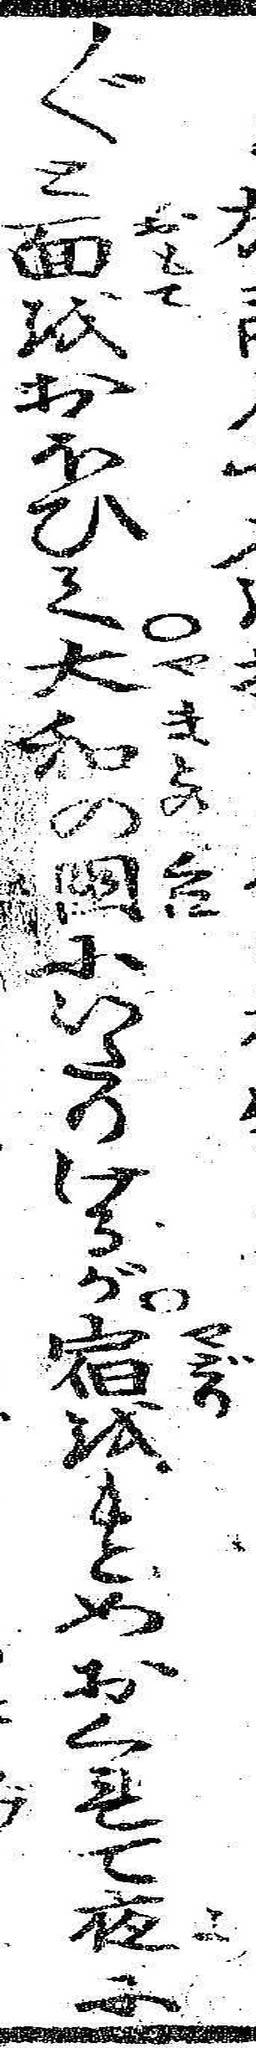〴〵と面をおほひて。大和の国にいたりけるが。宿をもとめおくれて夜に
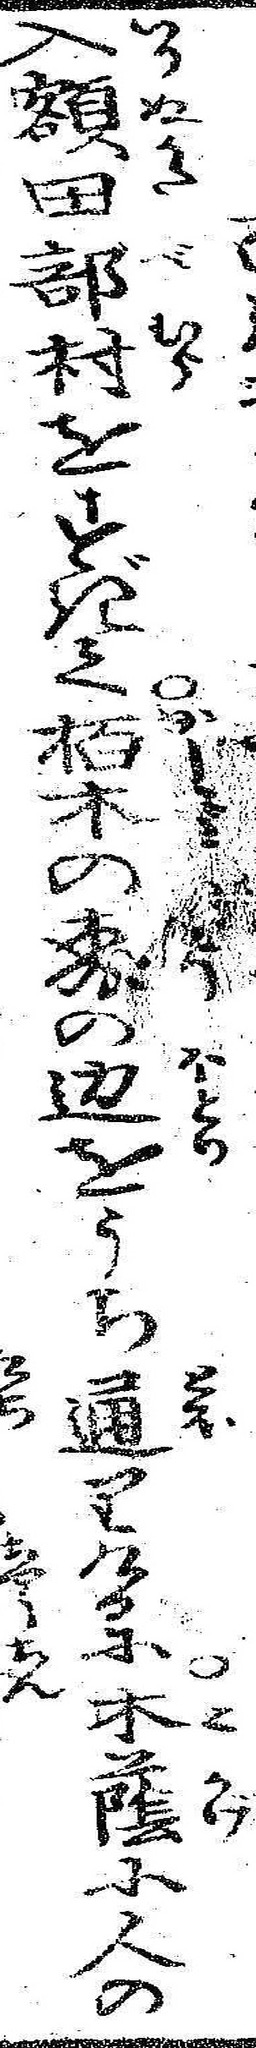入額田部村をすぎて。柏木の森の辺をうち通りけるに。木蔭に人の
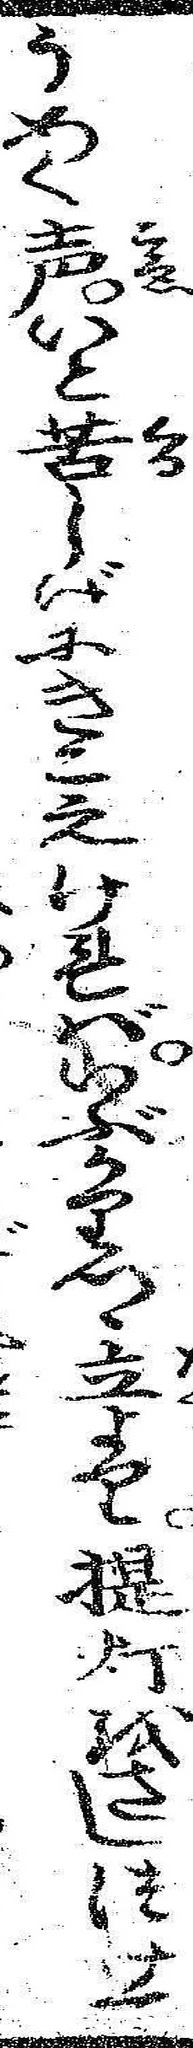うめく声。いと苦しげにきこえければ。いぶかりつゝ立より。提灯をさしつけて
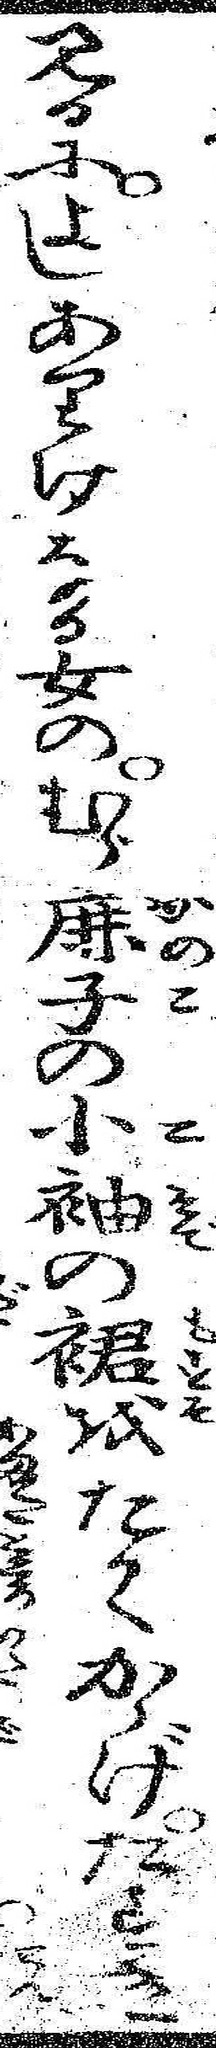見るに。よしありけなる女の。むら鹿子の小袖の裙をたかくかゝげ。たすき
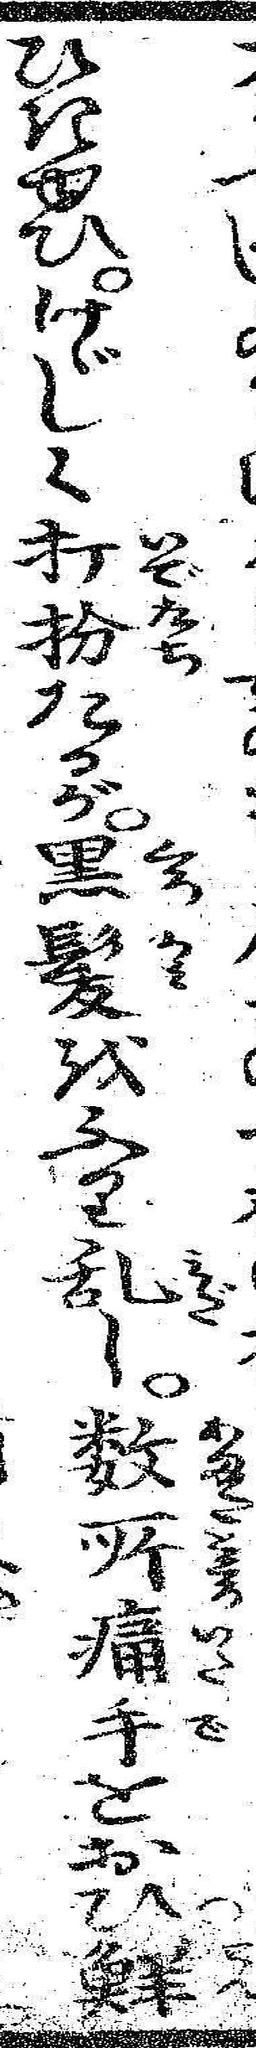ひきゆひ。けゞしく打扮たるが。黒髪をふり乱し。数所痛手をおひ。鮮
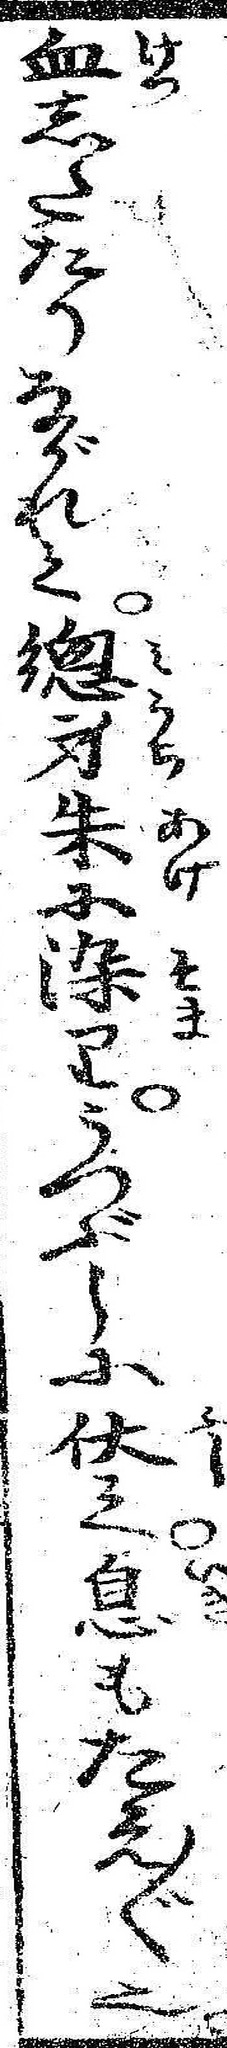血したたりながれて。総身朱に染り。うつぶしに伏て。息もたえ〴〵也。

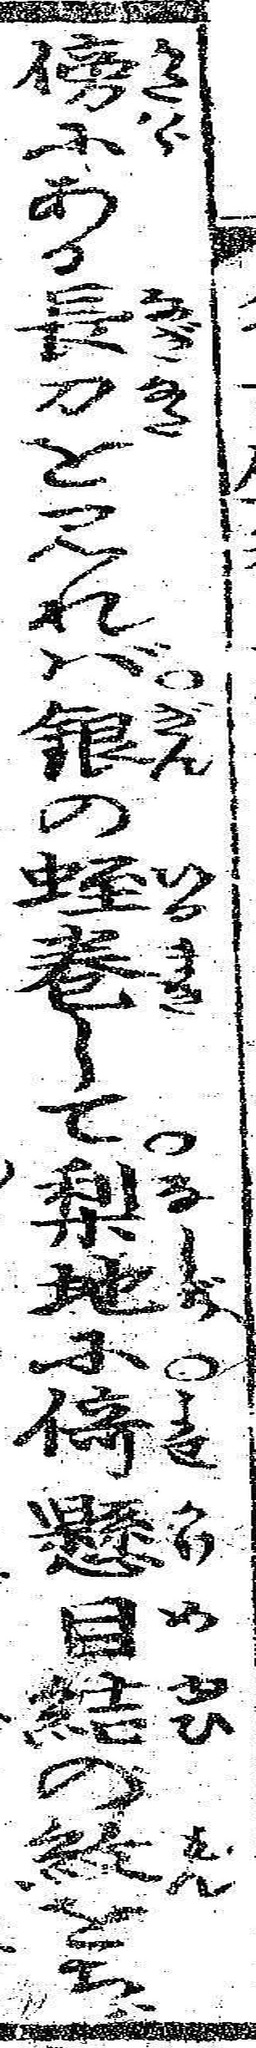傍にある長刀を見れば。銀の蛭巻して。梨地に。倚懸目結の紋をちら
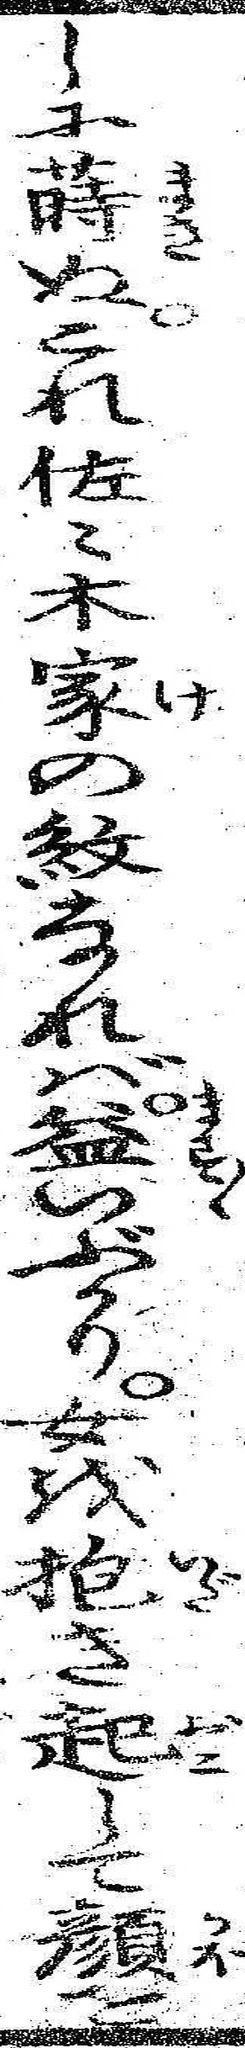しに蒔ぬ。これ佐々木家の紋なれば。益いぶかり。女を抱き起して顔を
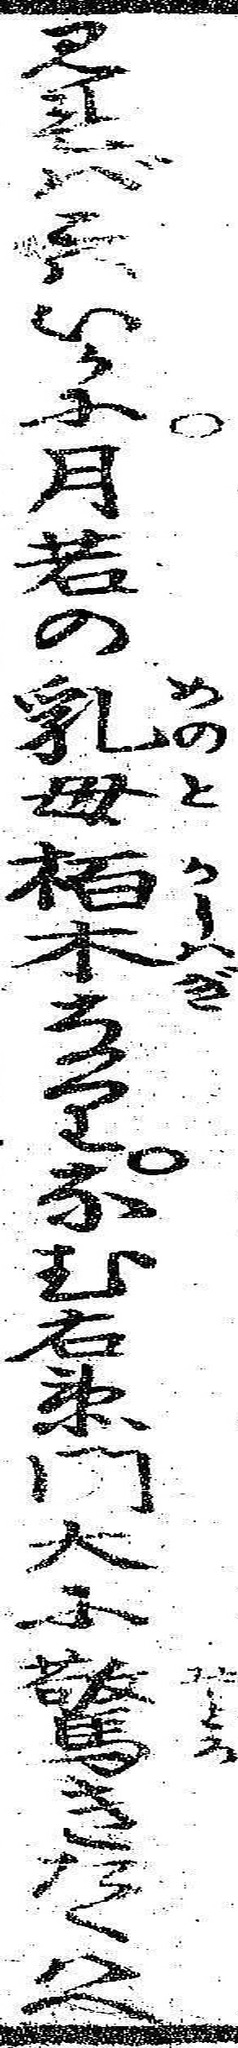見ればこはいかに。月若の乳母柏木なり。なむ右衛門大に驚きたくはへ
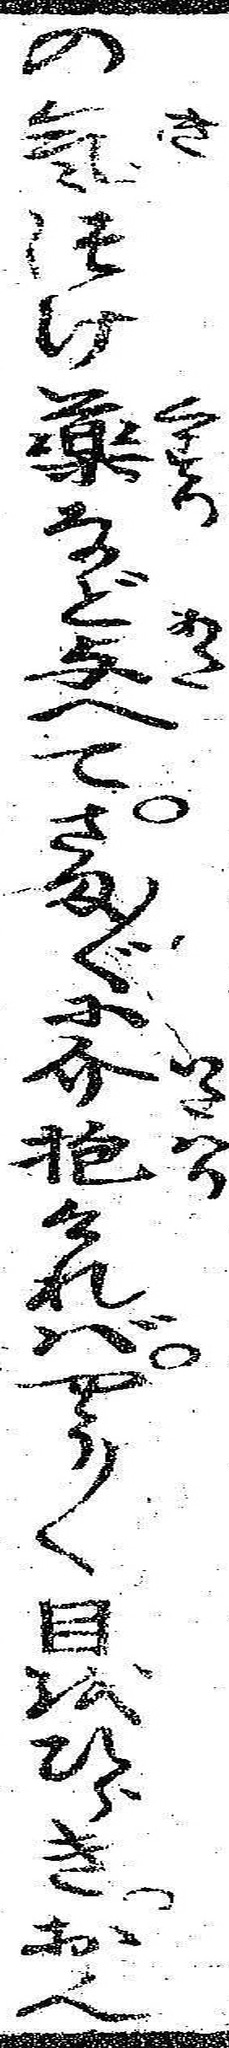の気つけ薬など与へて。さま〴〵に介抱ければ。やう〳〵目をひらき。おん
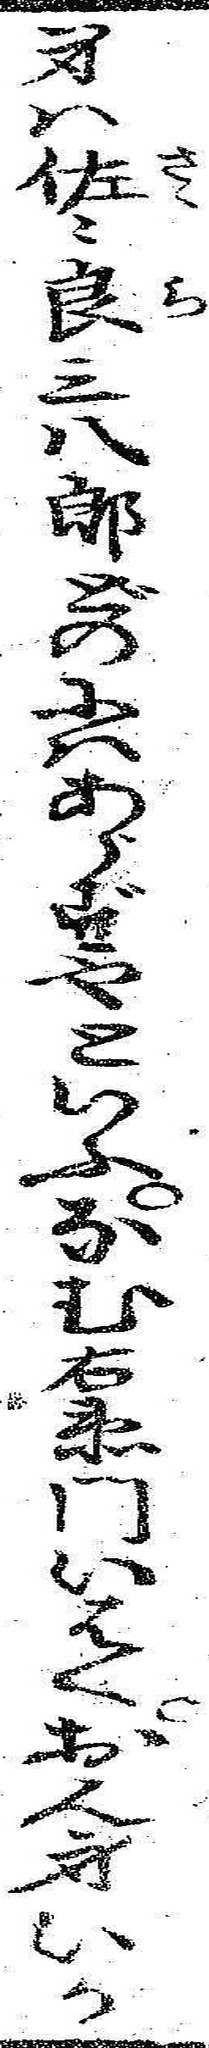身は佐々良三八郎どのにはあらずやといふ。なむ右衛門いはく。おん身いか
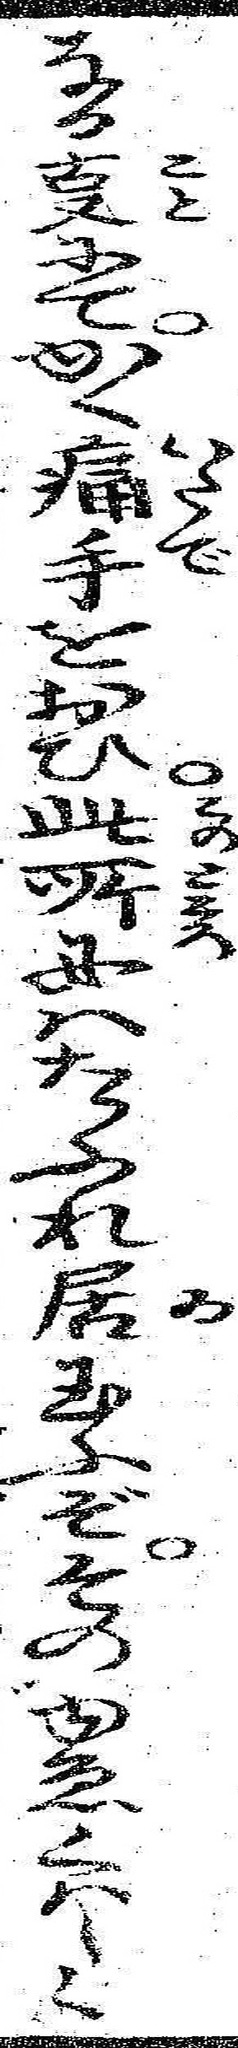なる事にて。かく痛手をおひ。此所にはたふれ居玉ふぞ。そのゆゑくはしく
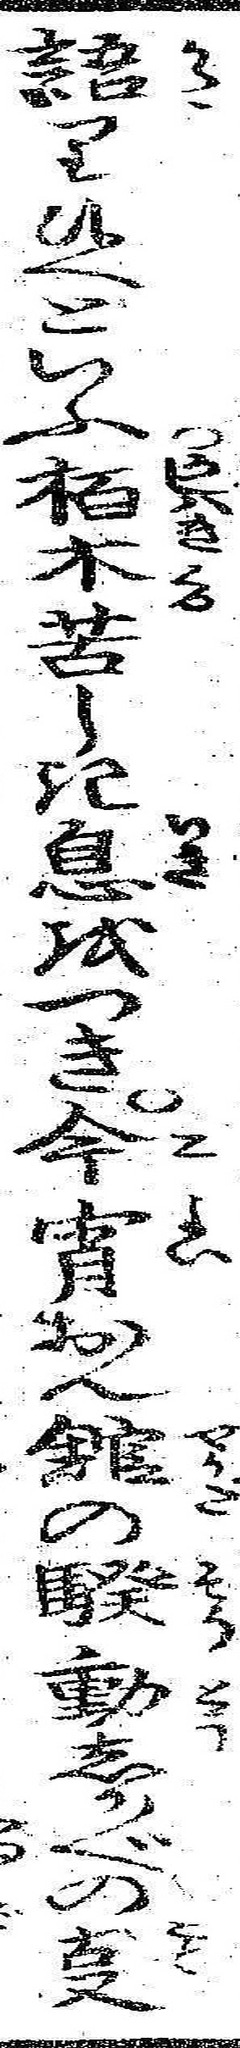語り候へといふ。柏木苦しき息をつき。今宵おん館の騤動しか〴〵の事
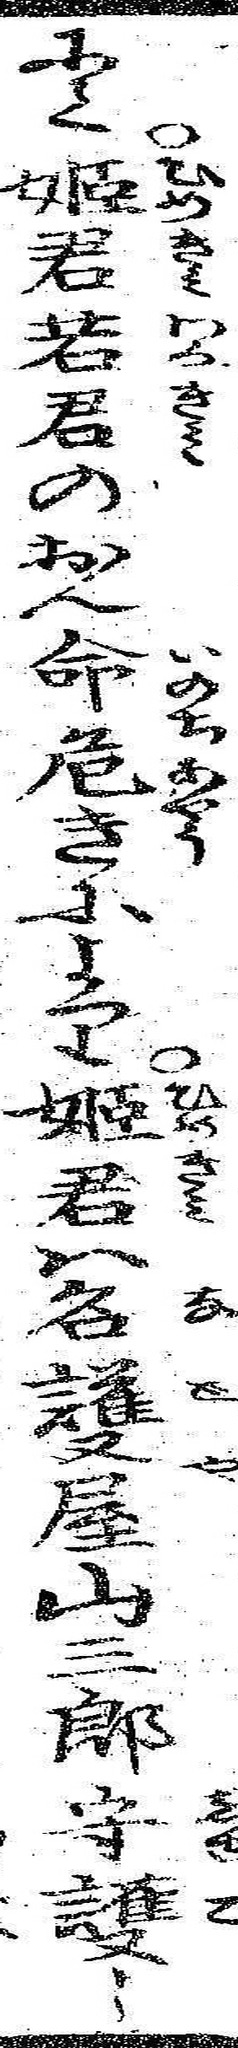にて。姫君若君のおん命危きにより。姫君は名護屋山三郎守護し
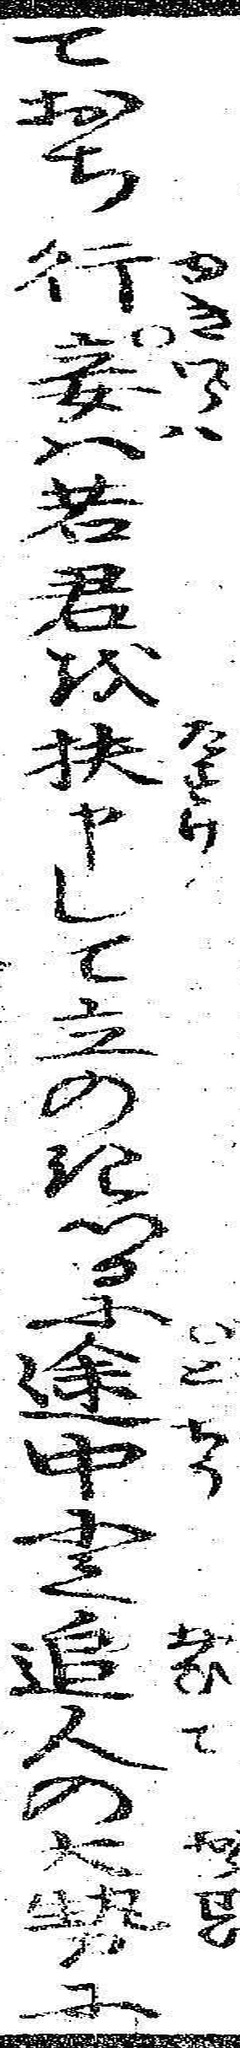ておち行。妾は若君を扶申して立のきつるに。途中にて追人の大勢に
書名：昔話稲妻表紙
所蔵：国文学研究資料館
